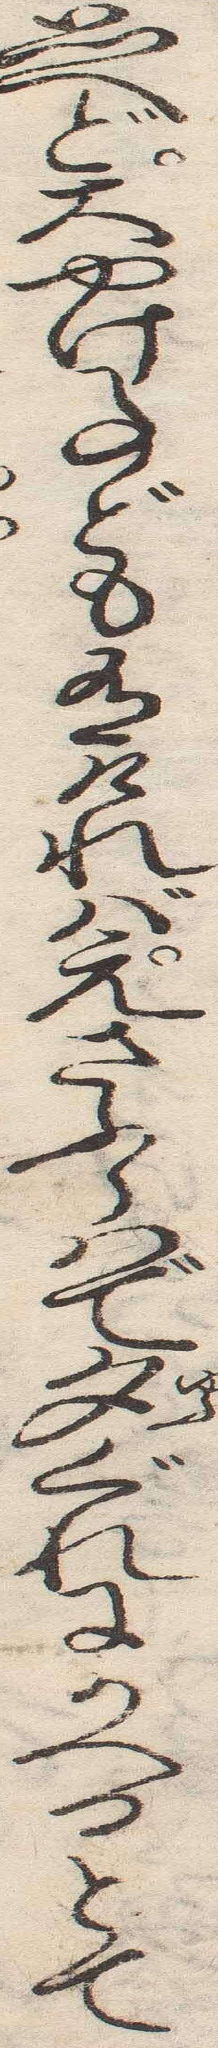思へど。大やけ事ども有ければ。えさふらはで夕ぐれにかへるとて
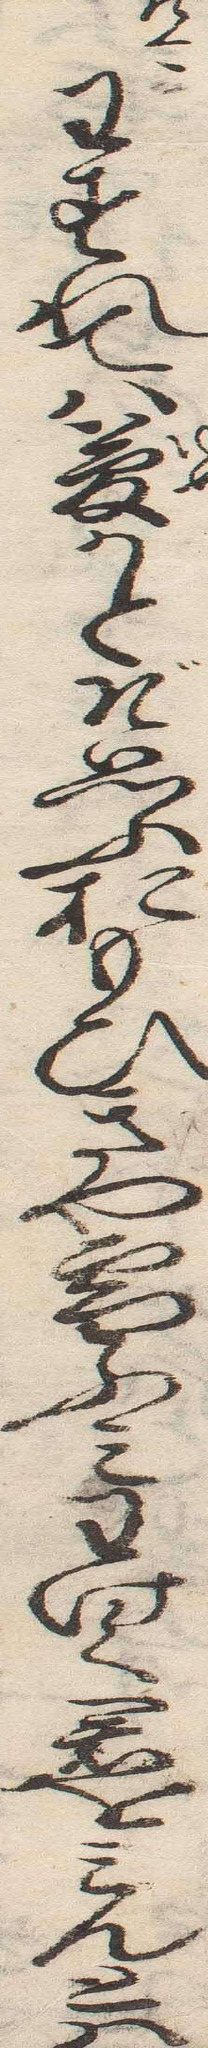古今わすれては夢かとぞ思ふおもひきや雪ふみわけて君をみんとは
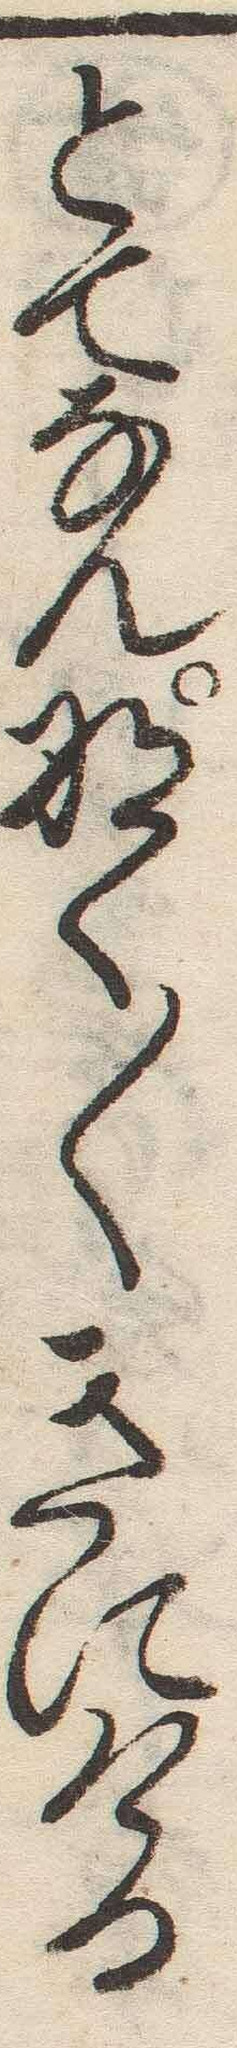とてなん。なく〳〵きにける

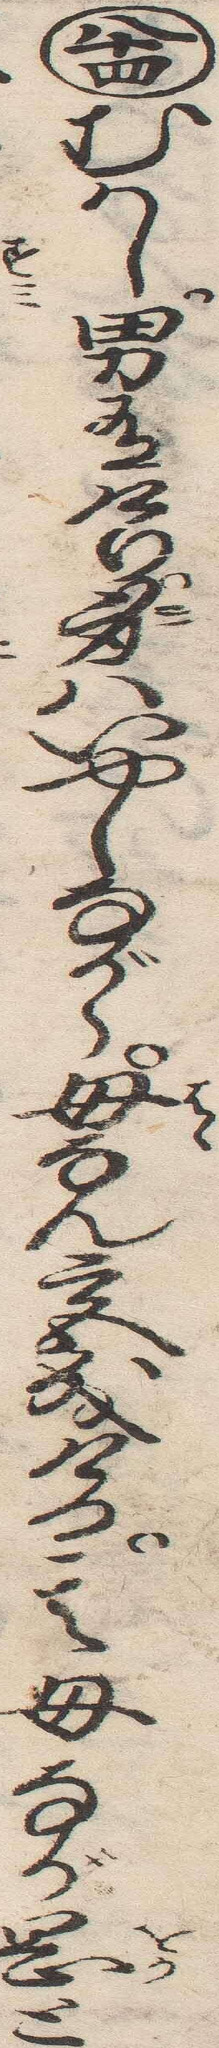八十四むかし。男有けり身はいやしながら。母なん宮成ける。其母なが岡と
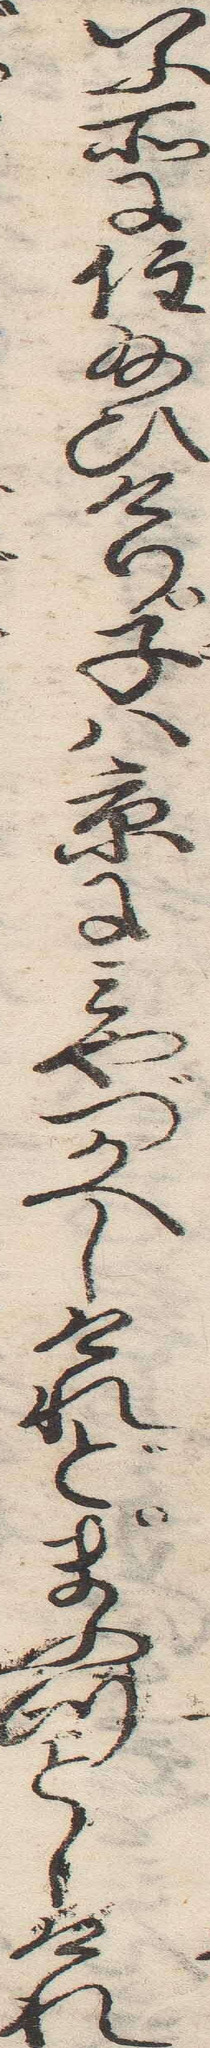いふ所に住給ひけり。子は京にみやづかへしけれど。まふつとしけれ
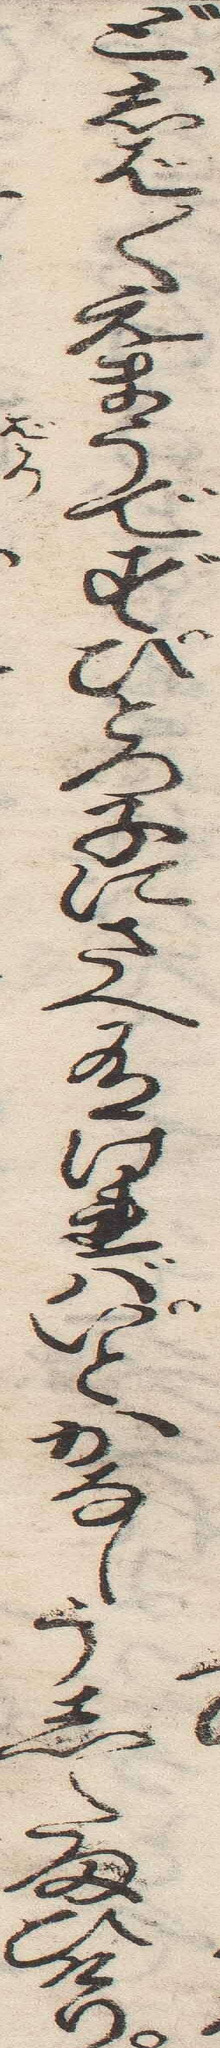ど。しば〳〵えまうでず。ひとつ子にさへ有ければ。いとかなしうしたまひけり。
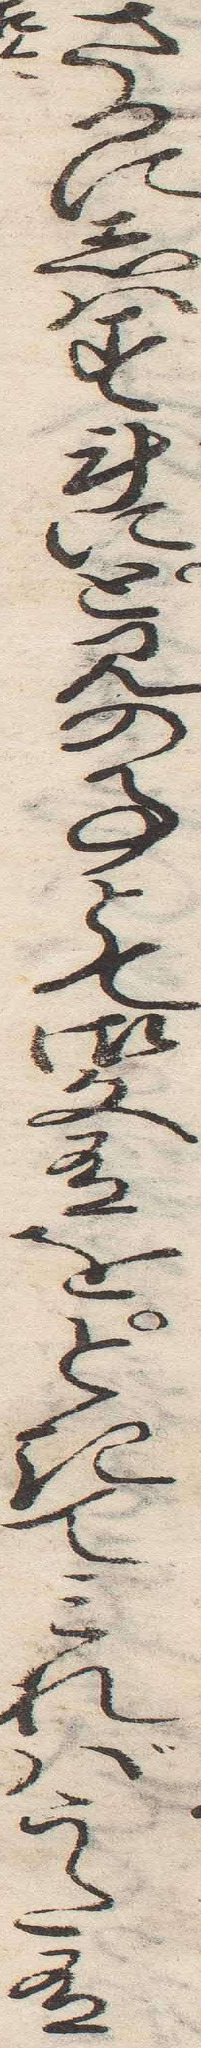さるにしはす計に。とみの事とて御文有を。ときてみればうた有
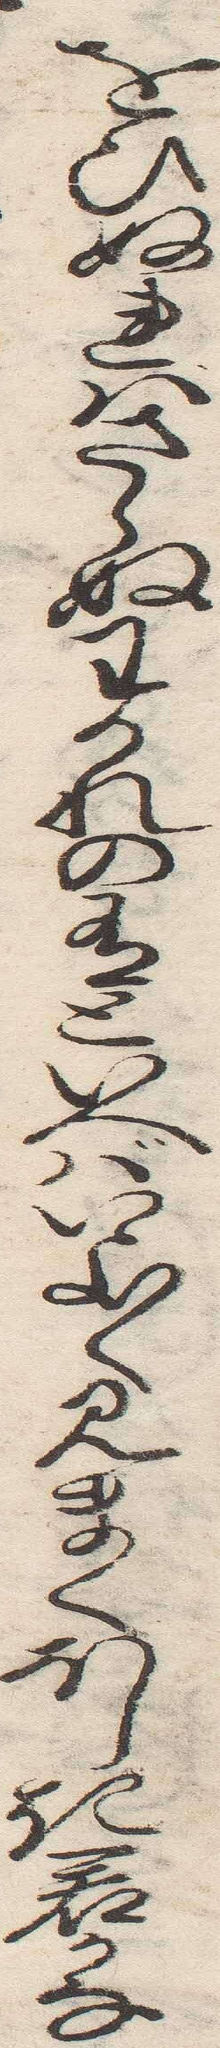古今をひぬれはさらぬわかれの有といへばいよ〳〵見まくほしき君かな
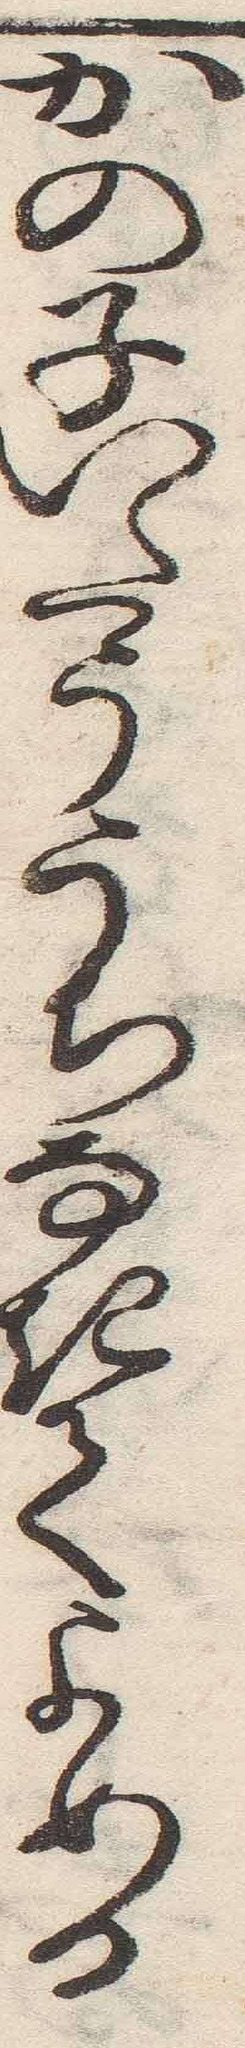かの子いたううちなきてよめる
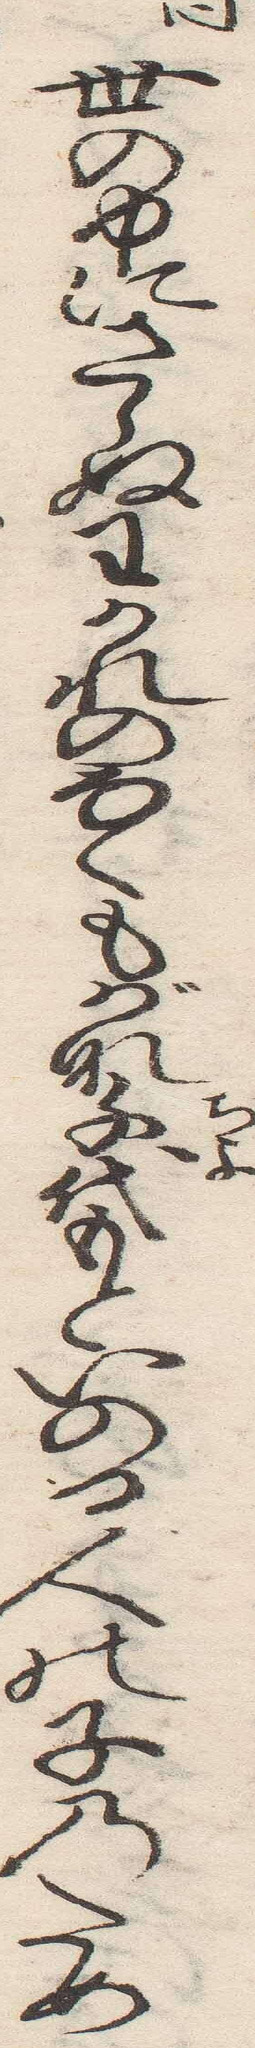同世の中にさらにわかれのなくもがな千代もといのる人の子のため
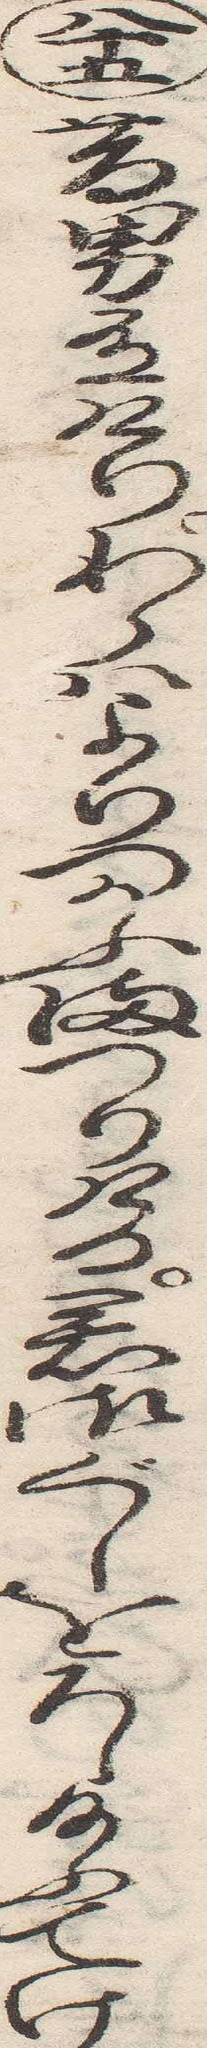八十五昔男有けり。わらはよりつかふまつりける。君御ぐしをろし給ふてけ
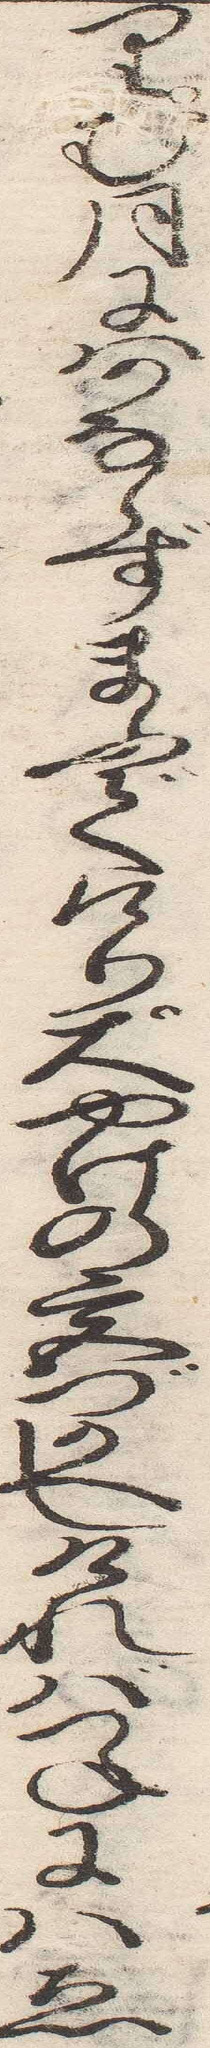り。む月にはかならずまふでけり。大やけの宮づかへしければつねにはゑ
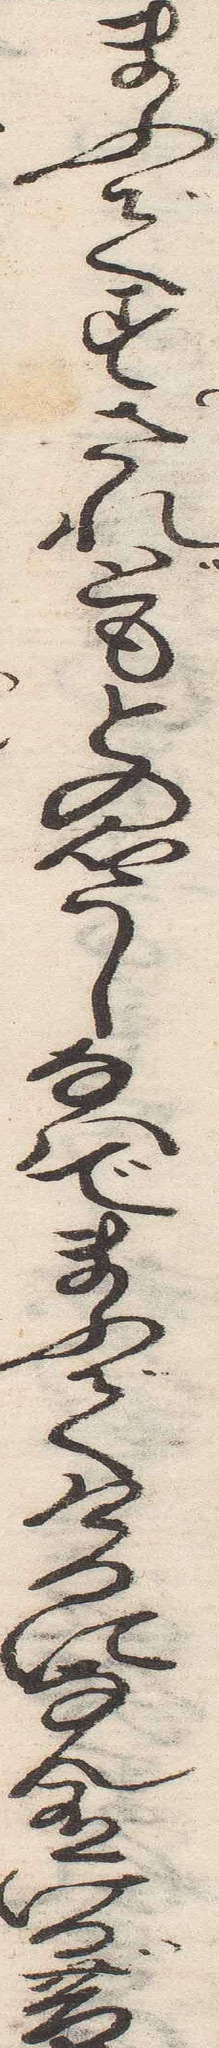まふです。されどもとの心うしなはでまふでけるになん有ける。昔
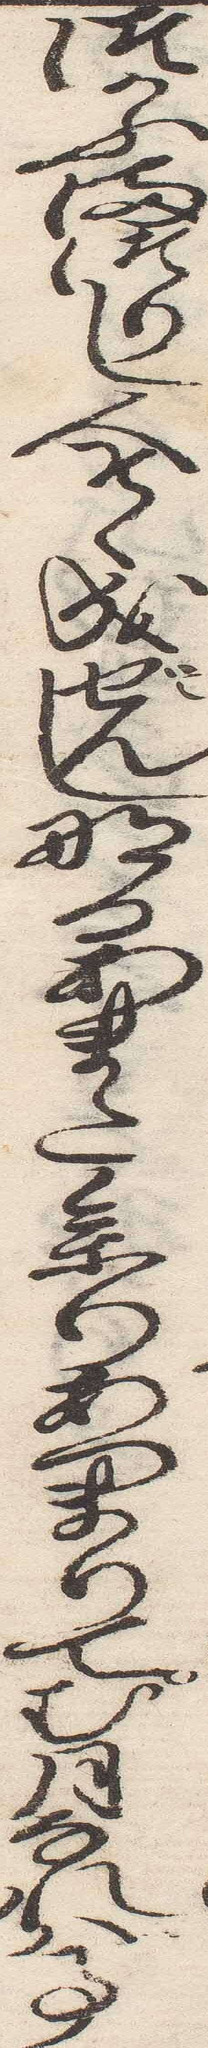つかふまつりし人そく成。ぜんしなるあまた参りあつまりて。む月なれば事
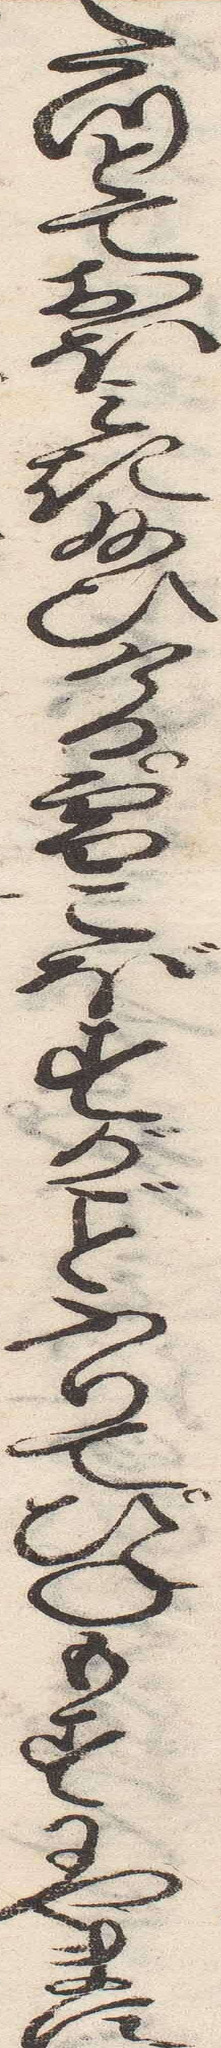たつとておほみき給ひける。雪こぼすがごとふりて。ひねもすにやます
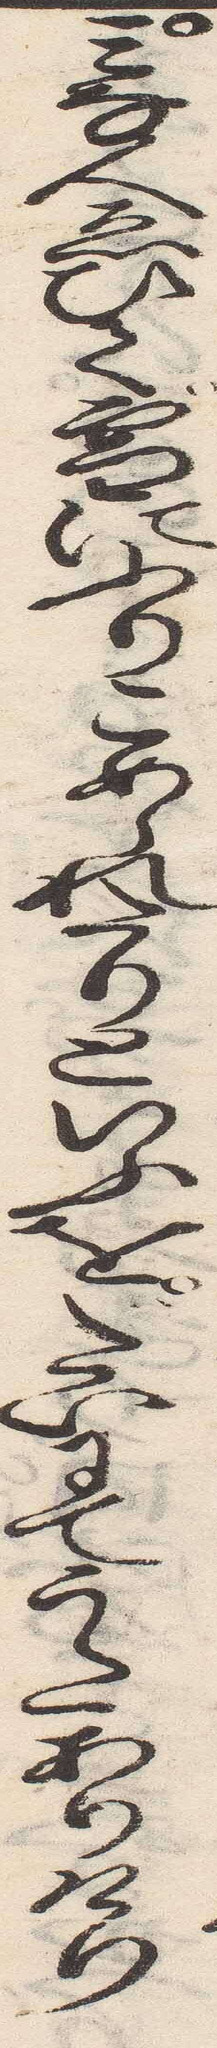。みな人ゑひて。雪にふりこめられたりといふを。だいにてうたありけり
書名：伊勢物語
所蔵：東京学芸大学附属図書館 国文学研究資料館
